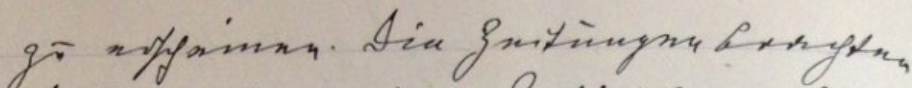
zu erscheinen. Die Zeitungen brachten
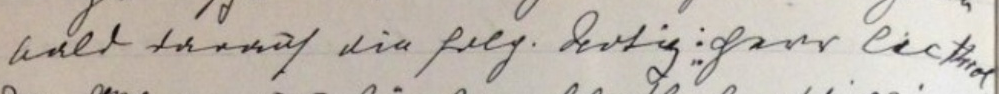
bald darauf die folg. Notiz: „Herr lic. theol.
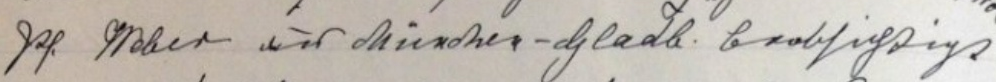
Pf. Weber aus München-Gladb. Beabsichtigt
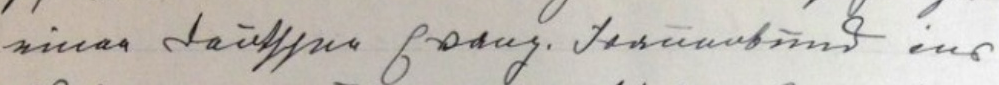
einen deutschen Evang. Frauenbund ins
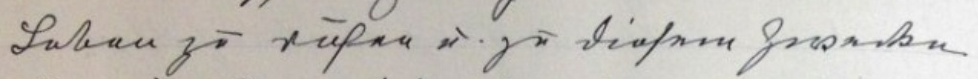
Leben zu rufen u. zu diesem Zwecke
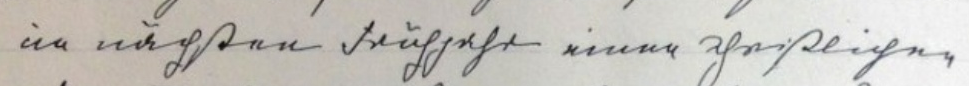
Zwecke im nächsten Frühjahr einen christlichen
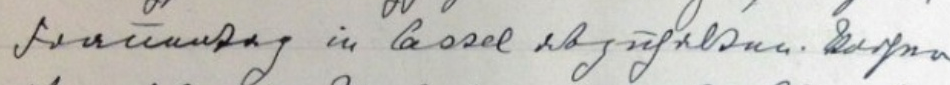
Frauentag in Cassel abzuhalten. Vorher
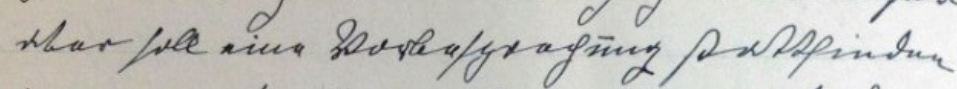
aber soll eine Vorbesprechung stattfinden
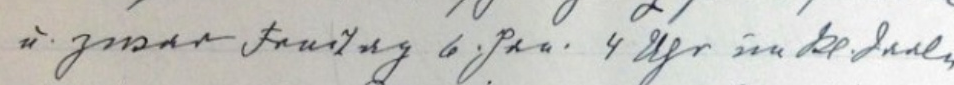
u. zwar Freitag 6. Jan. 4 Uhr im kl. Saale
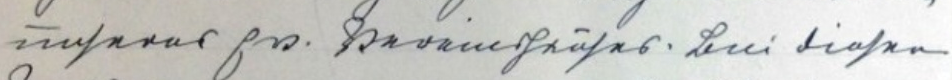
unseres Ev. Vereinshauses. Bei dieser
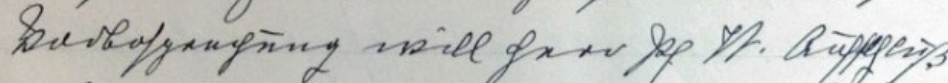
Vorbesprechung will Herr Pf. W. Aufschluß
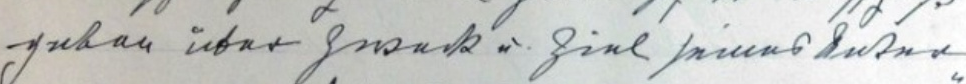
geben über Zweck u. Ziel seines Unter
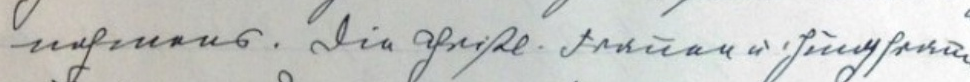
nehmens. Die christl. Frauen und Jungfrauen
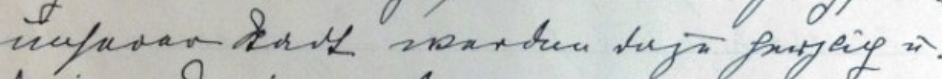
unserer Stadt wurden dazu herzlich u.
